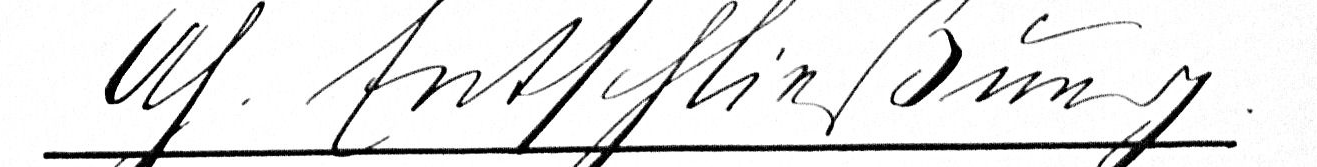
Ah. Entschließung.
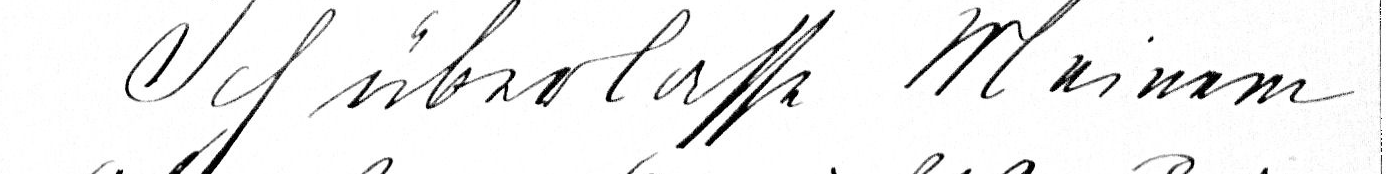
Ich überlasse Meinem
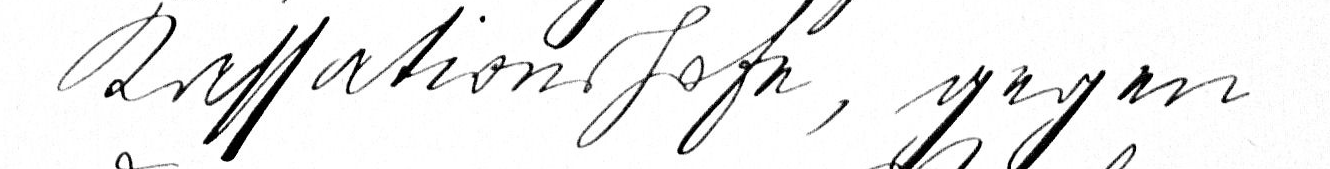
Kassationshofe, gegen
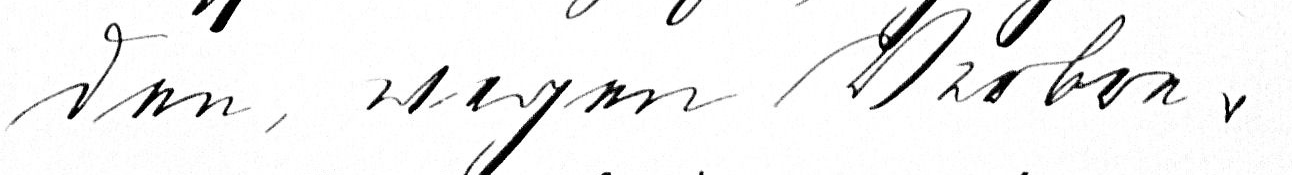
den, wegen Verbre¬
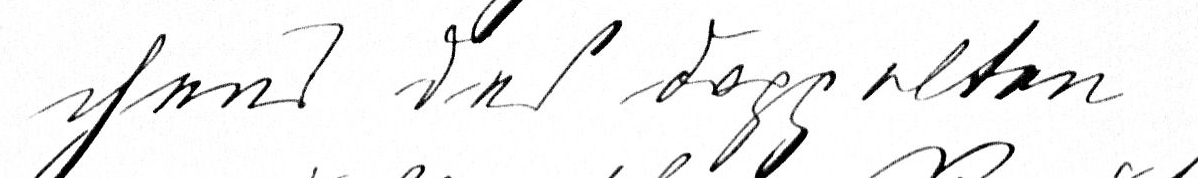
chens des doppelten
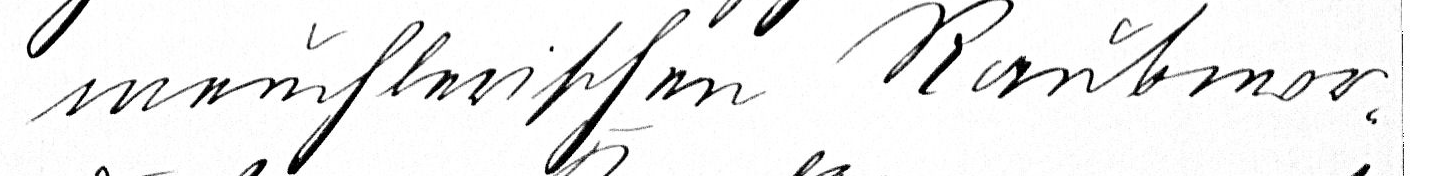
meuchlerischen Raubmor¬
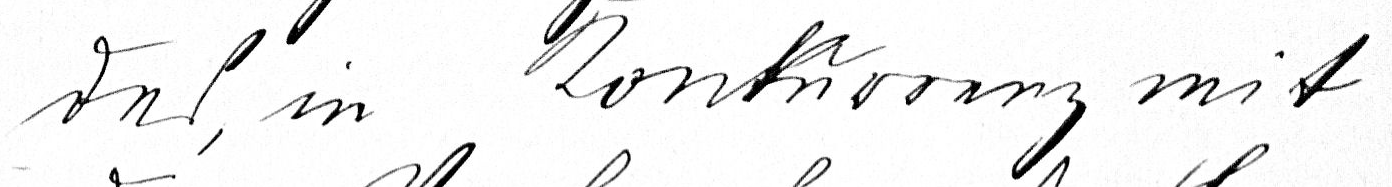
des, in Konkurrenz mit
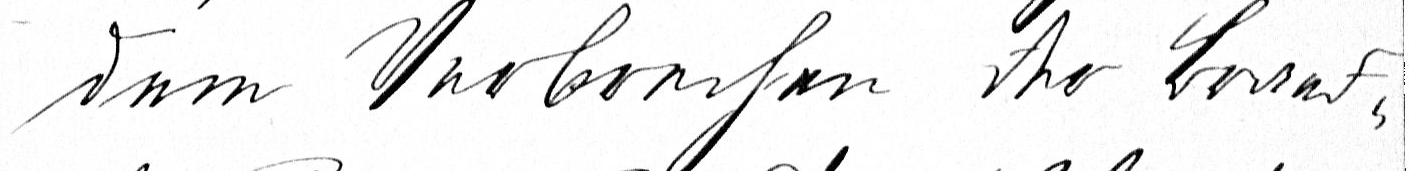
dem Verbrechen der Brand¬
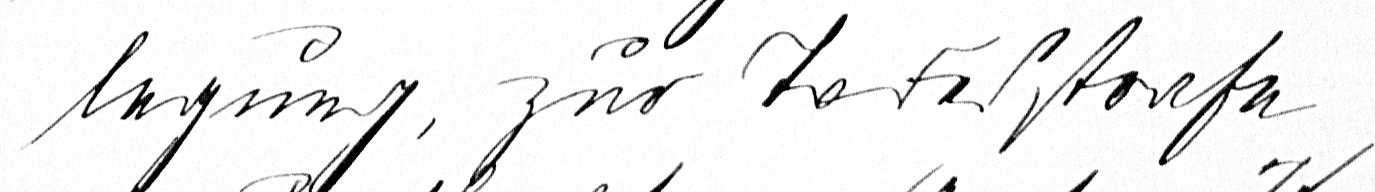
legung, zur Todesstrafe
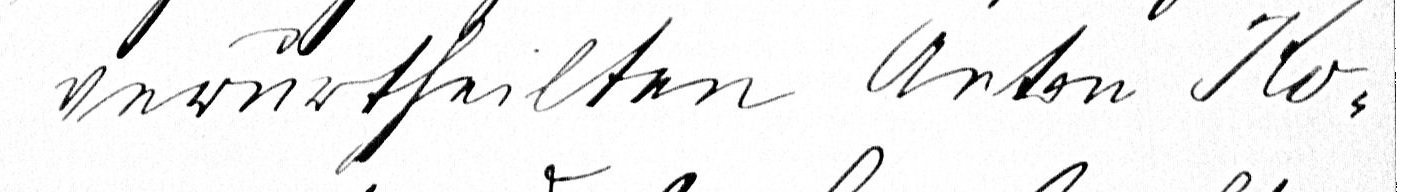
verurtheilten Anton Ko¬
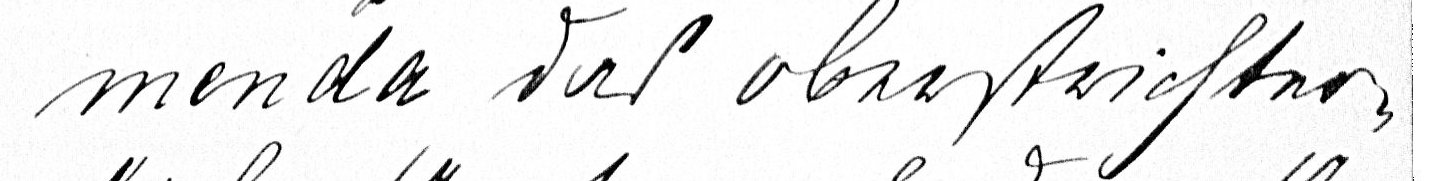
menda das oberstrichter¬
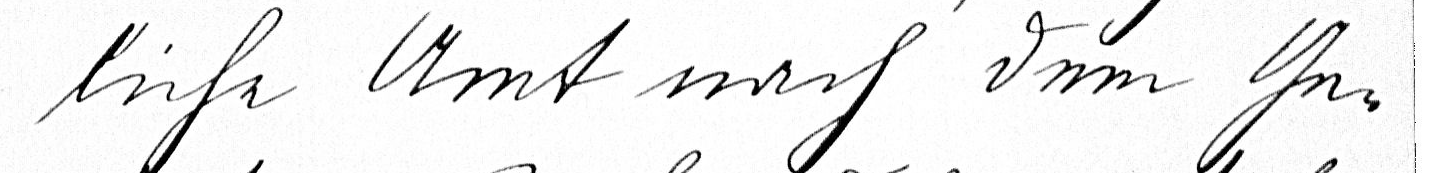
liche Amt nach dem Ge¬
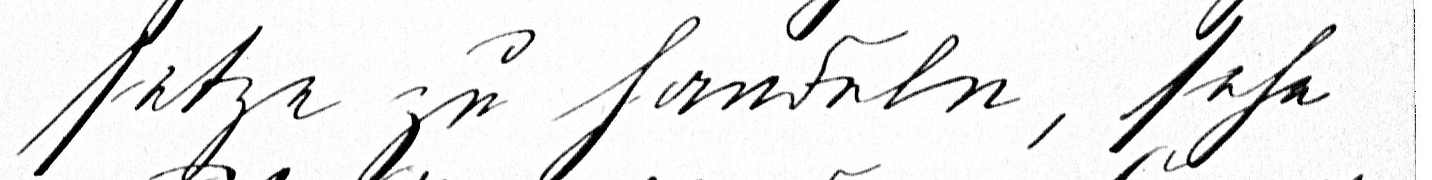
setze zu handeln, sehe
